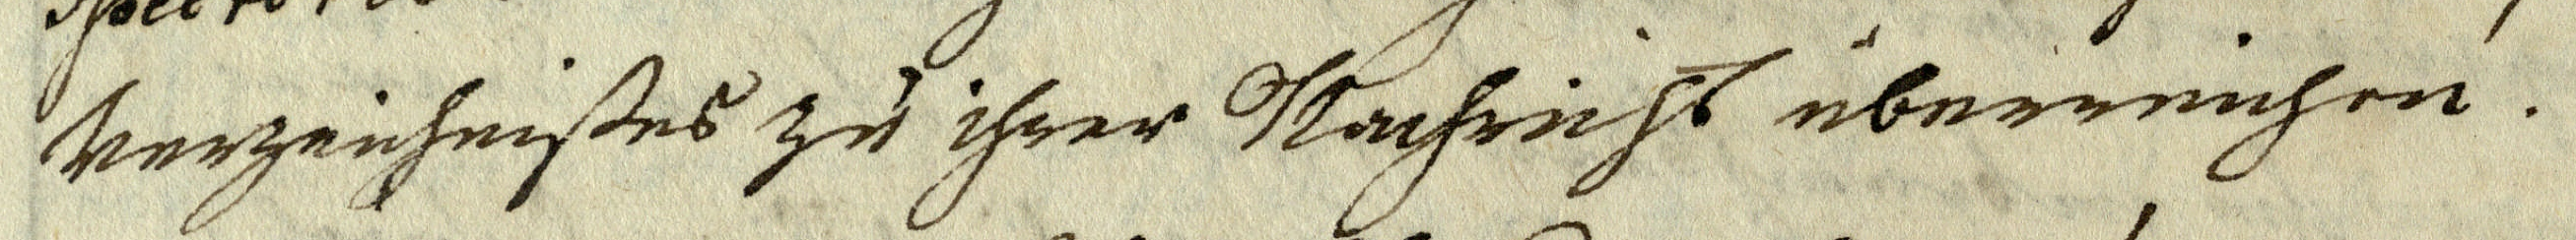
Verzeichnißes zu ihrer Nachricht überreichen.
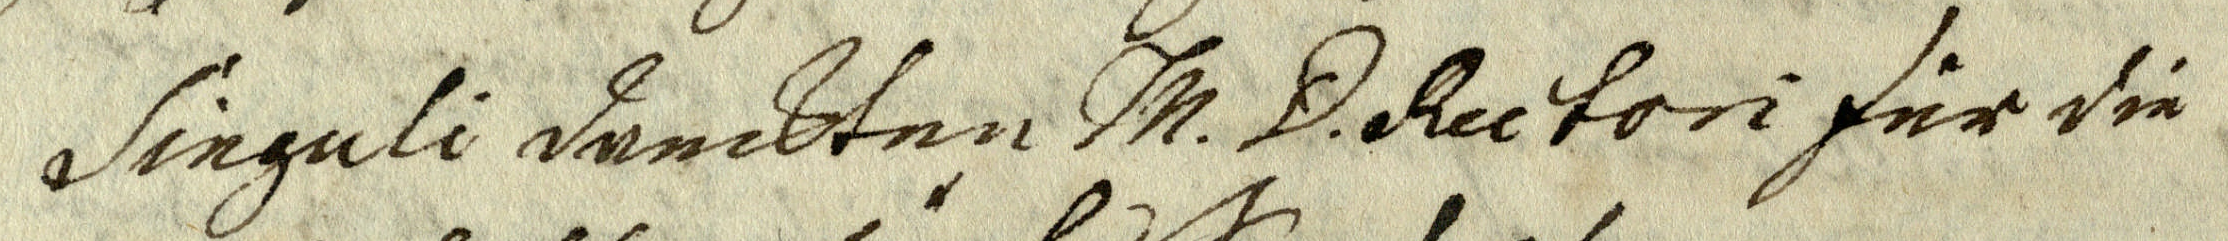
Singuli danckten M. D. Rector für die
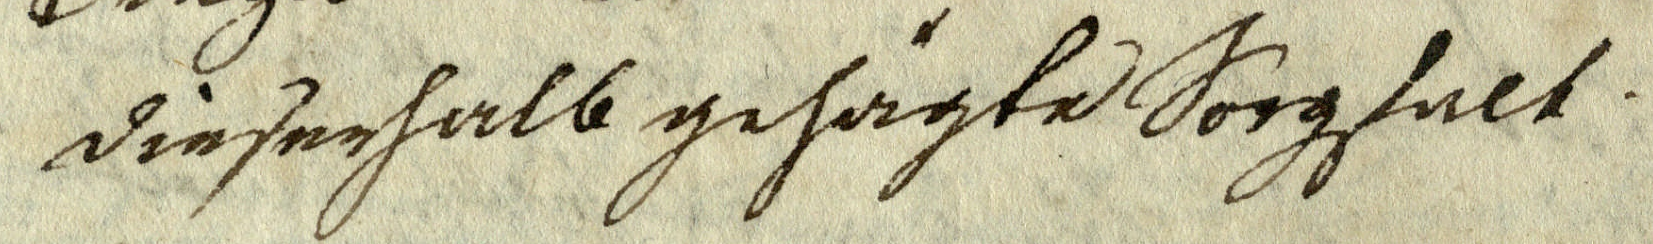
dieserhalb gehägte Sorgfalt.
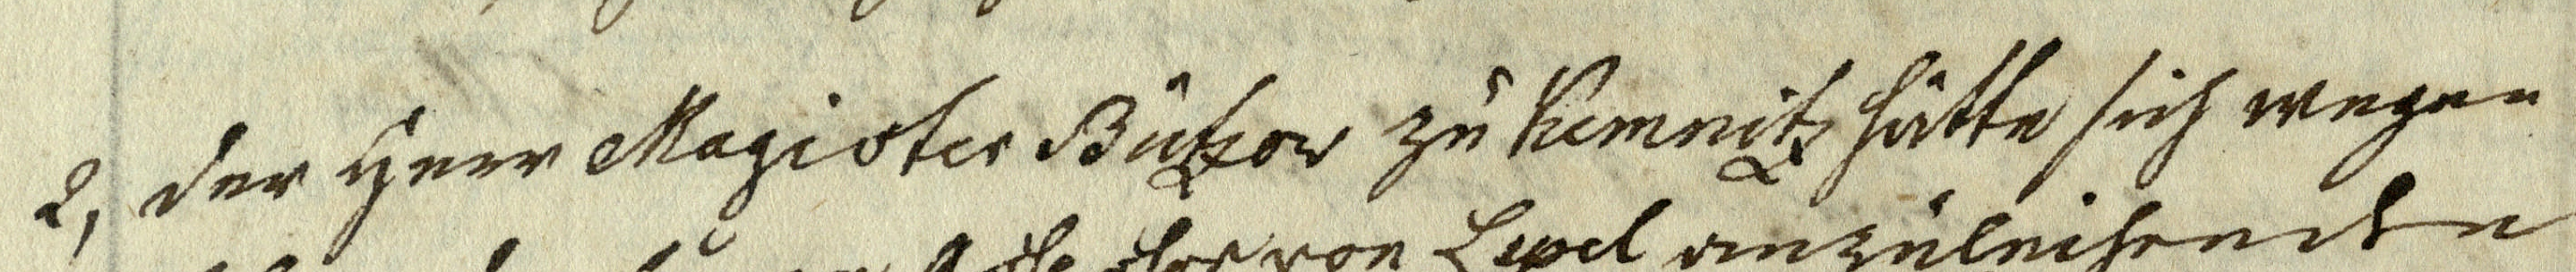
2. Der Herr Magister Bützow zu Kemnitz hätte sich wegen
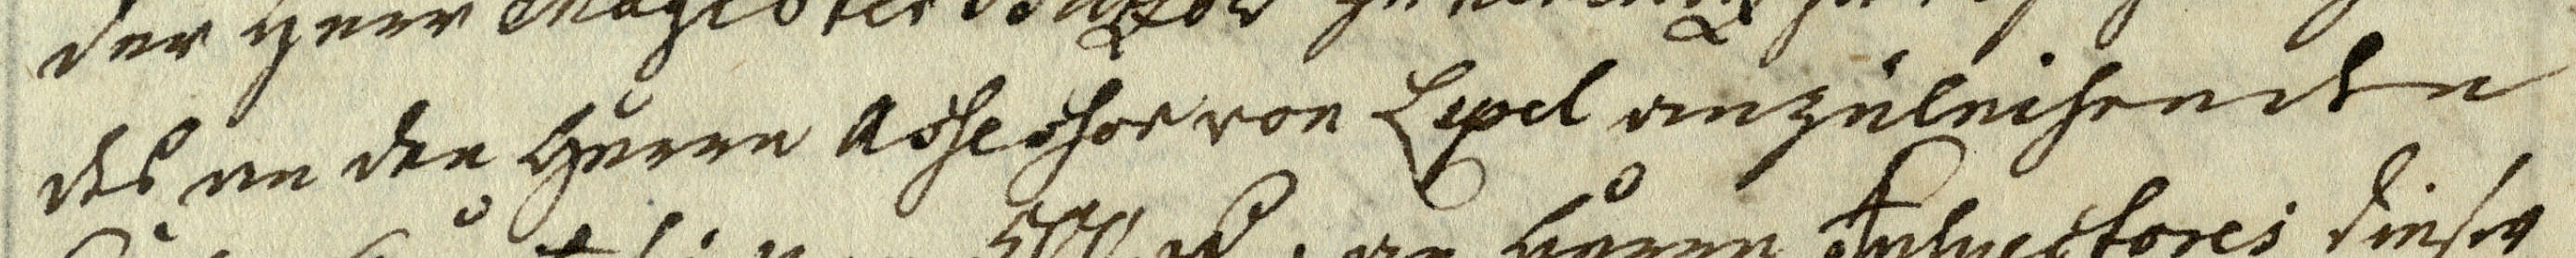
des an den Herrn Assessor von Lepel anzuleihenden
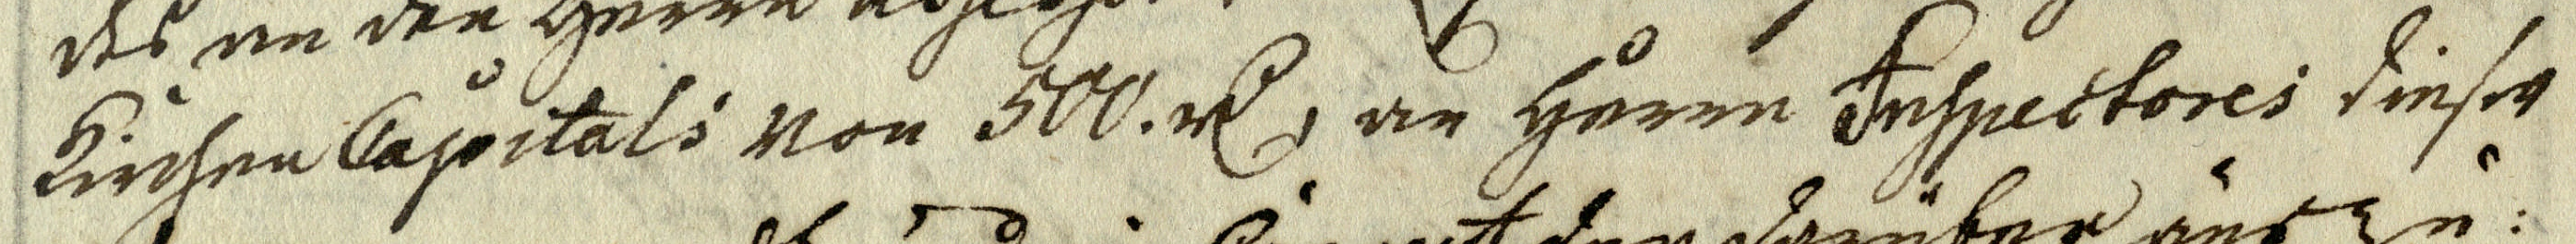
Kirchen Capitals von 500. r. an Herrn Inspectores dieser
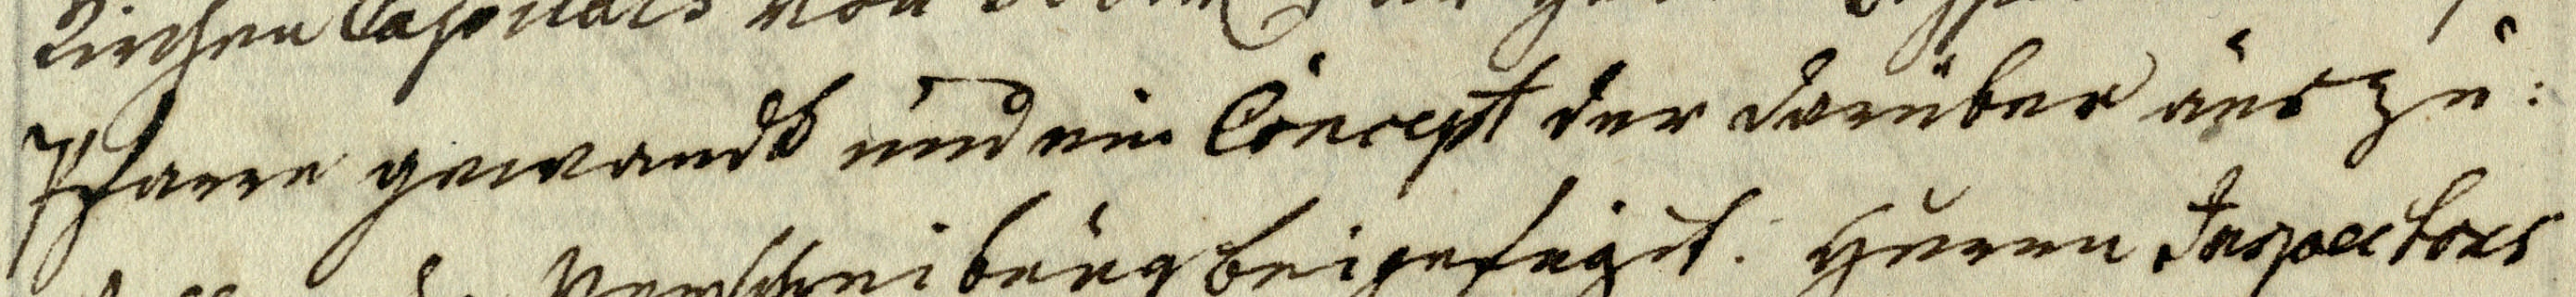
Pfarre gewandt und ein Concept der darüber auszu¬
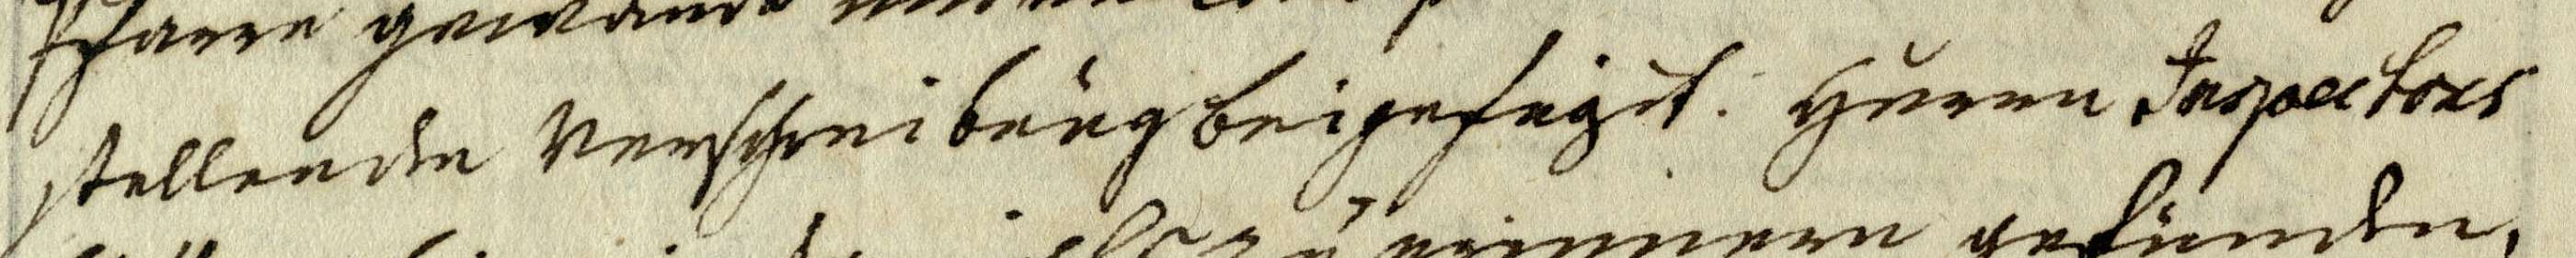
stellenden Verschreibung beigefüget. Herrn Inspectores
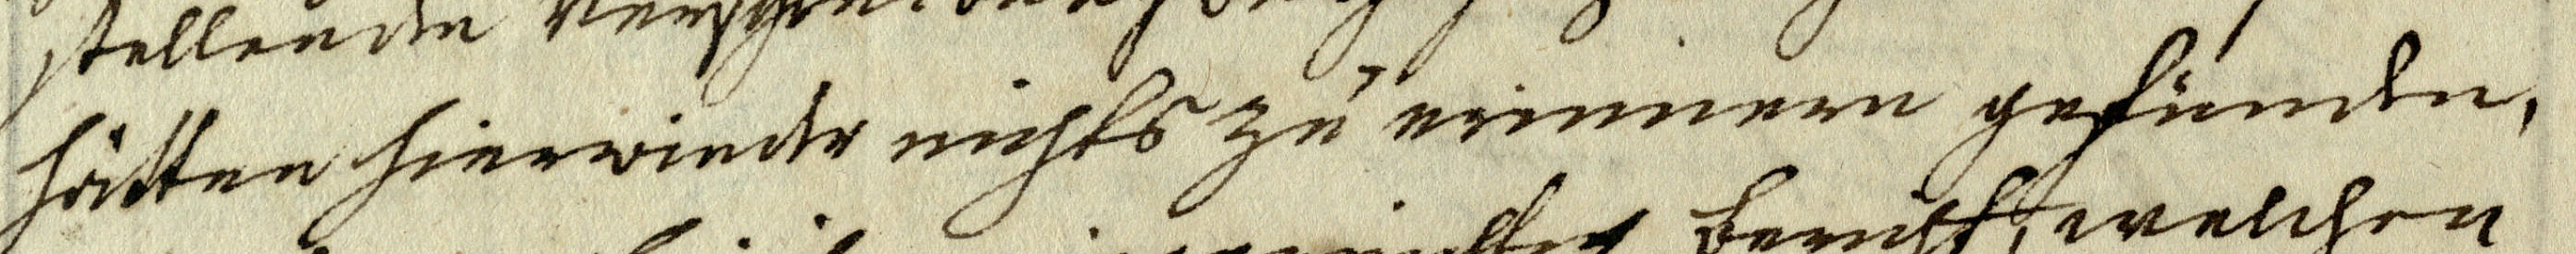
hätten hier wieder nichts zu erinnern gefunden,
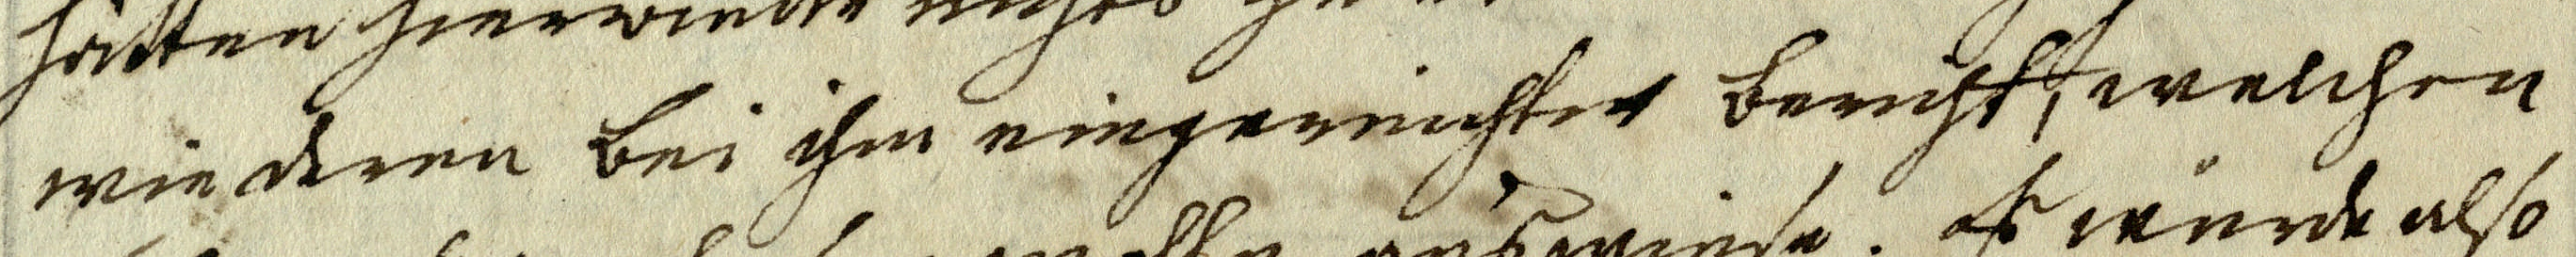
wie deren bei ihm eingereichter Bericht welchen
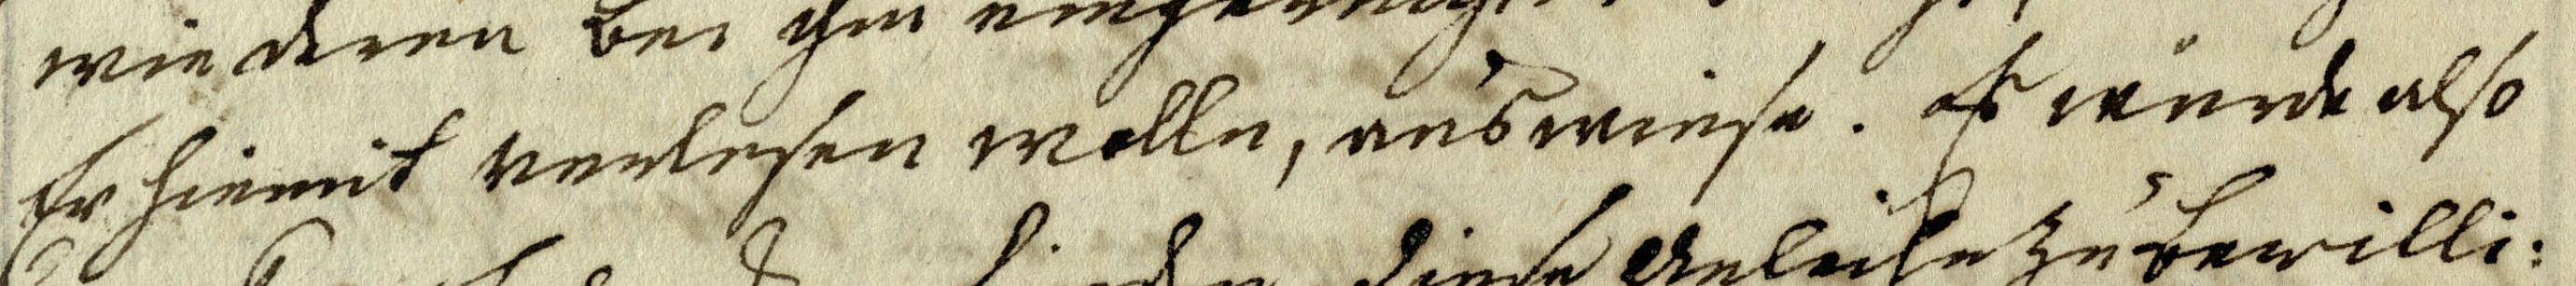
Er hiemit verlesen wolle, auswiese. Er würde also
